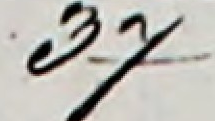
37
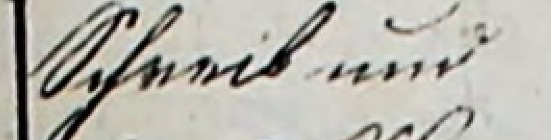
Schreib und
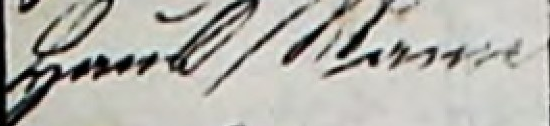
Haus Name
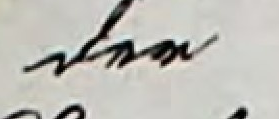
der
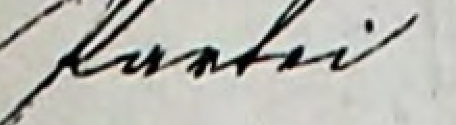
Partei.
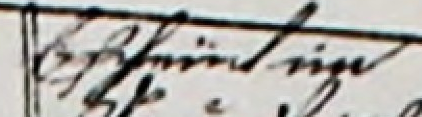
Esseint im
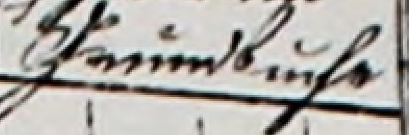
Grundbuche
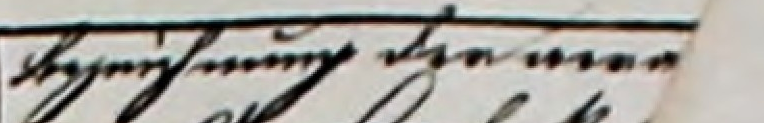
Bezeichnung der erarischen
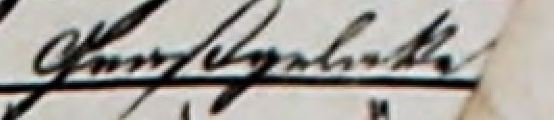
Graßgelake
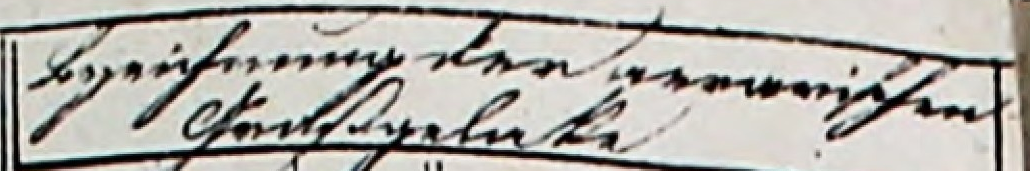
Bezeichnung der erarischen
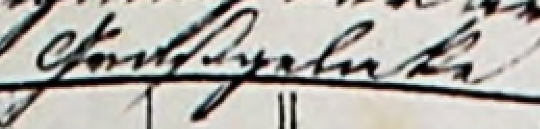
Graßgelake
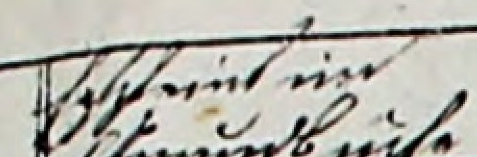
Esseint im
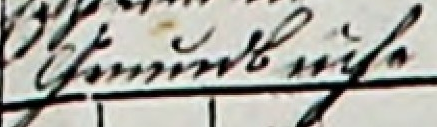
Grundbuche
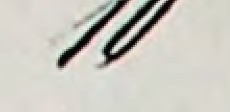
10
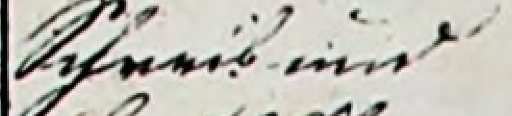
Schreib und
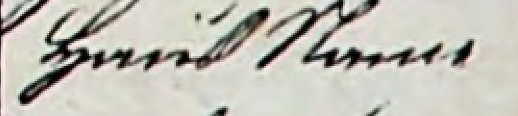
Haus Name
